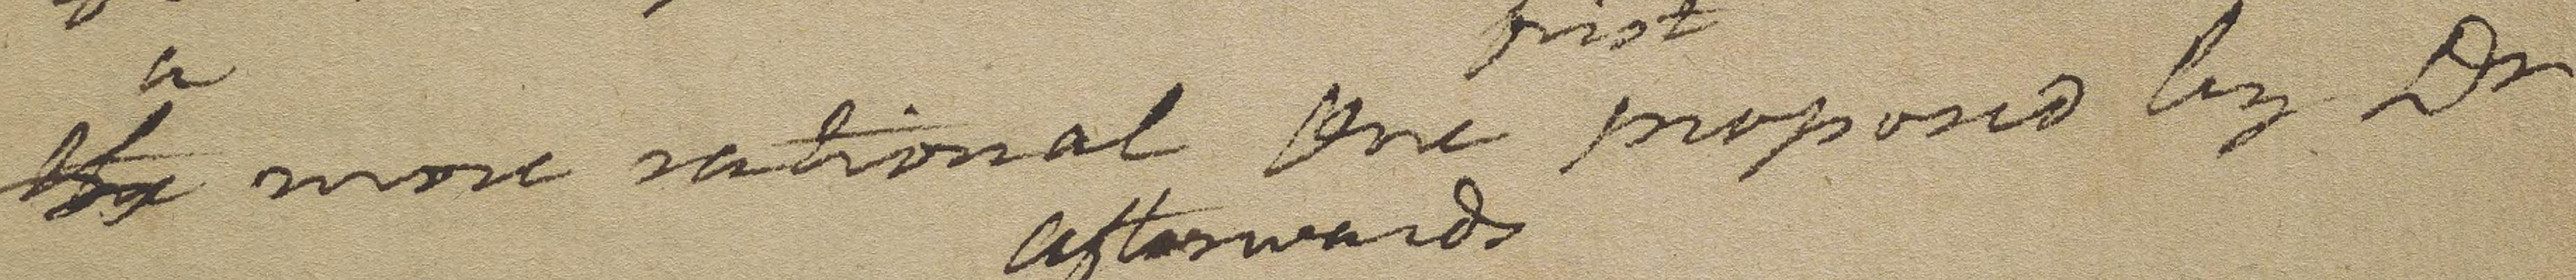[by] more rational one proposed by Dr.
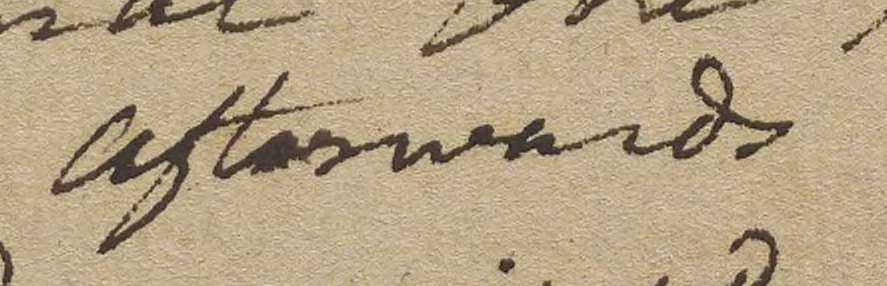afterwaards
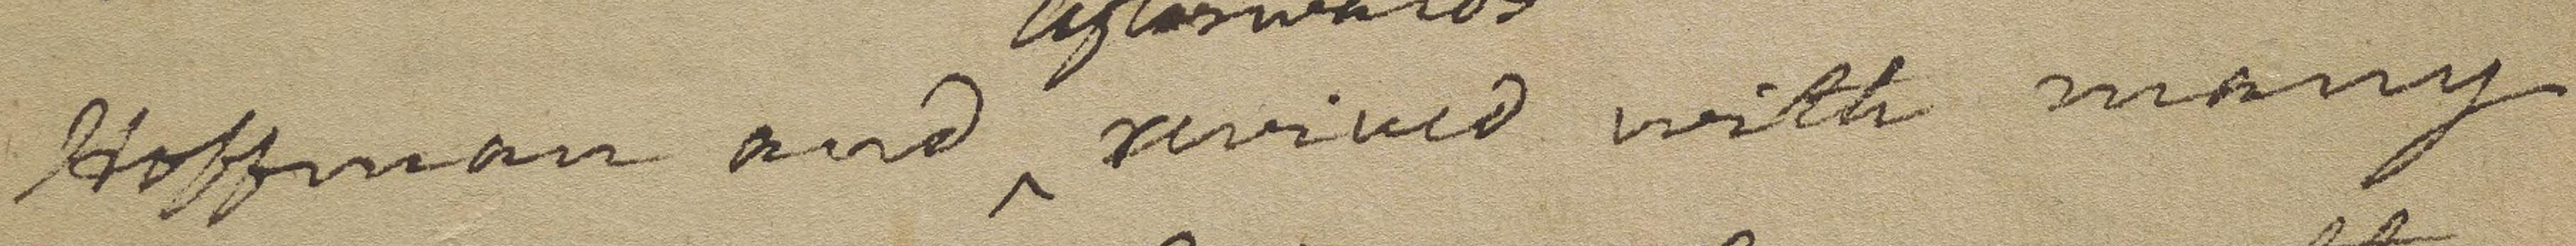Hoffman and ^ revived with many
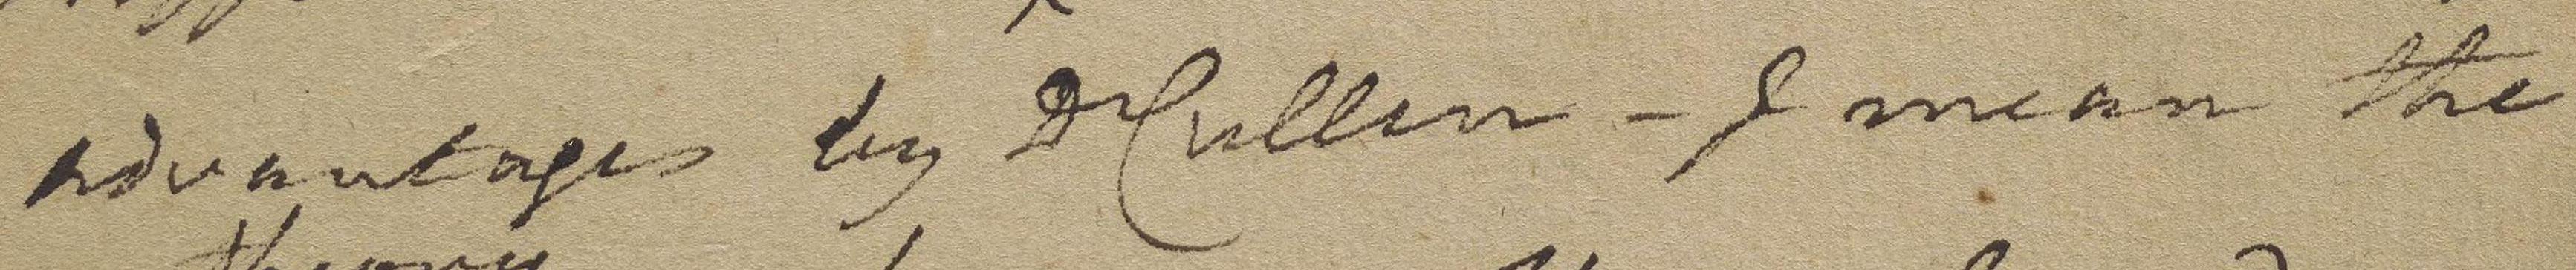advantages by D^r Cullen- I mean the
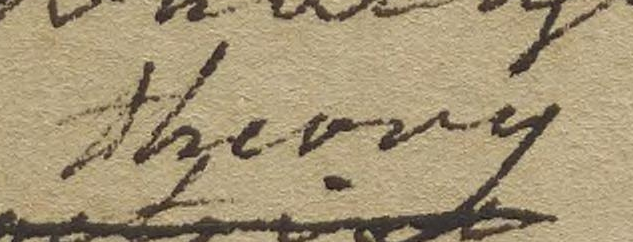theory
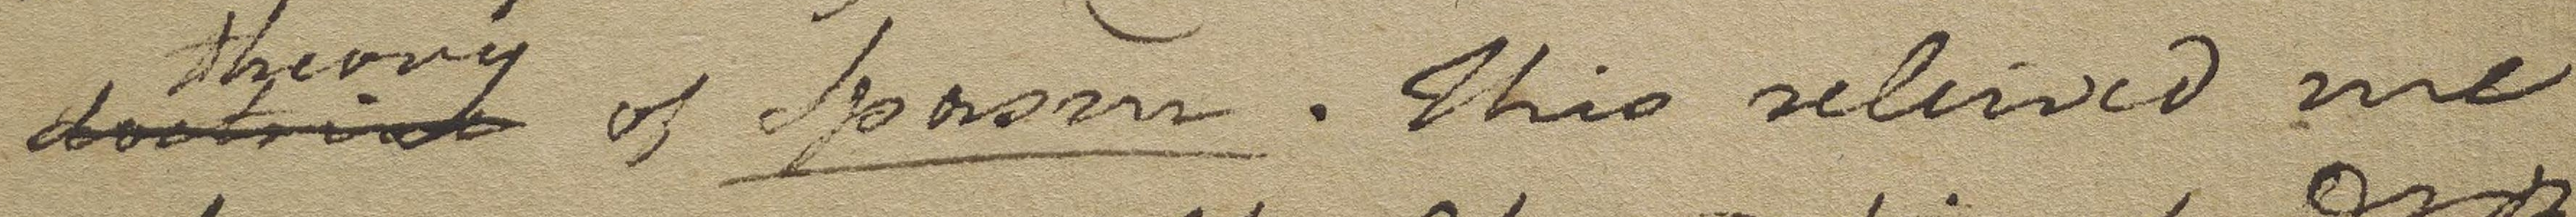[doctrine] of Spasm. This relieved me
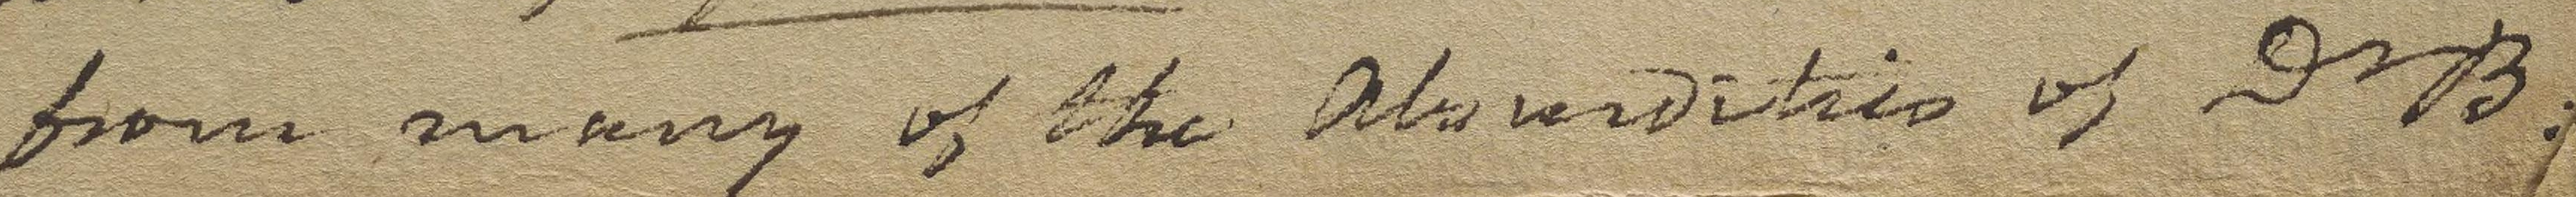from many of the Absurdities of Dr B.
